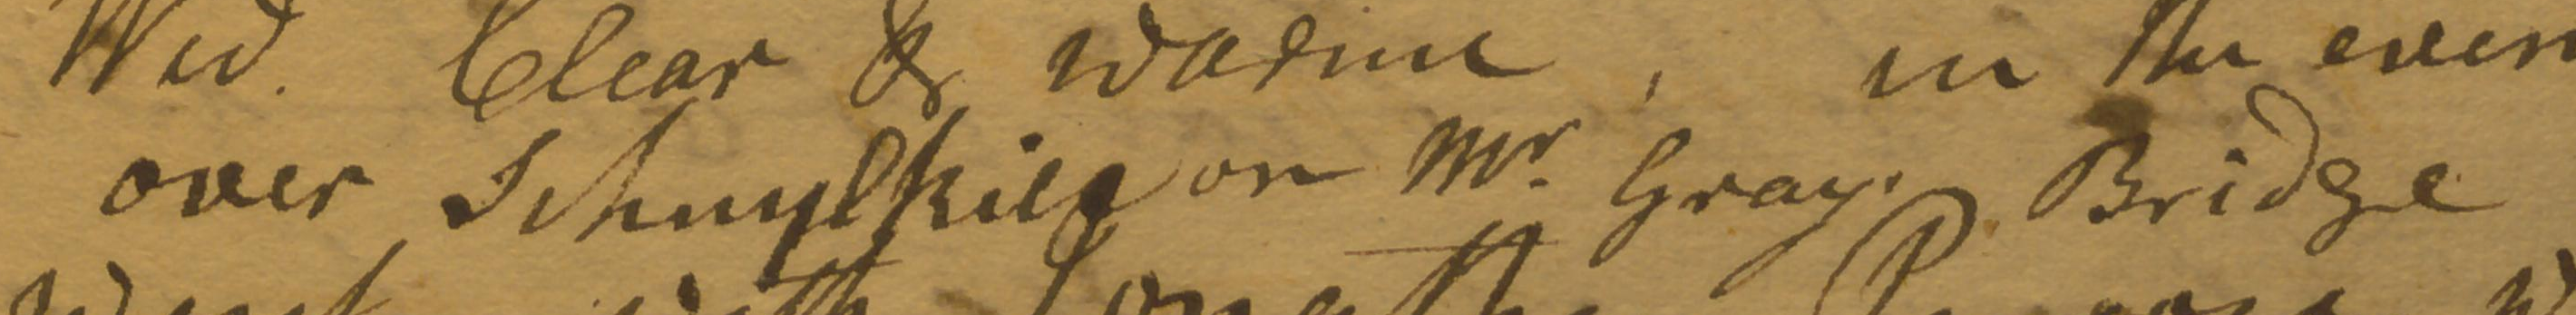over Schuylkile on M^r. Grays Bridge
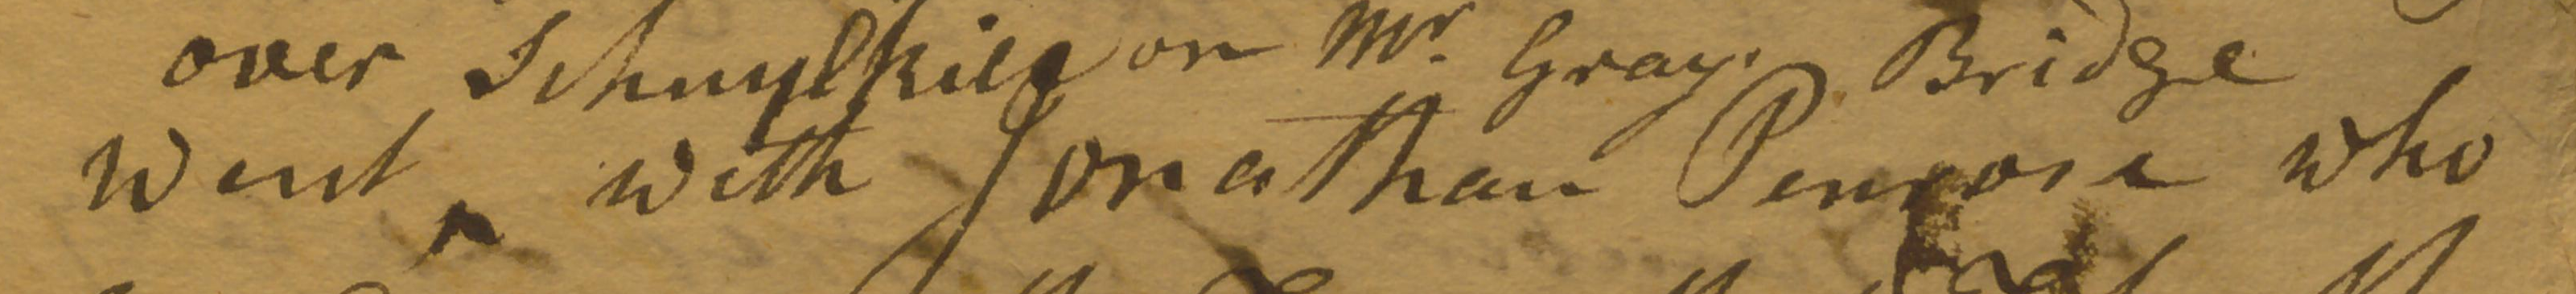went, with Joathan Penrose who
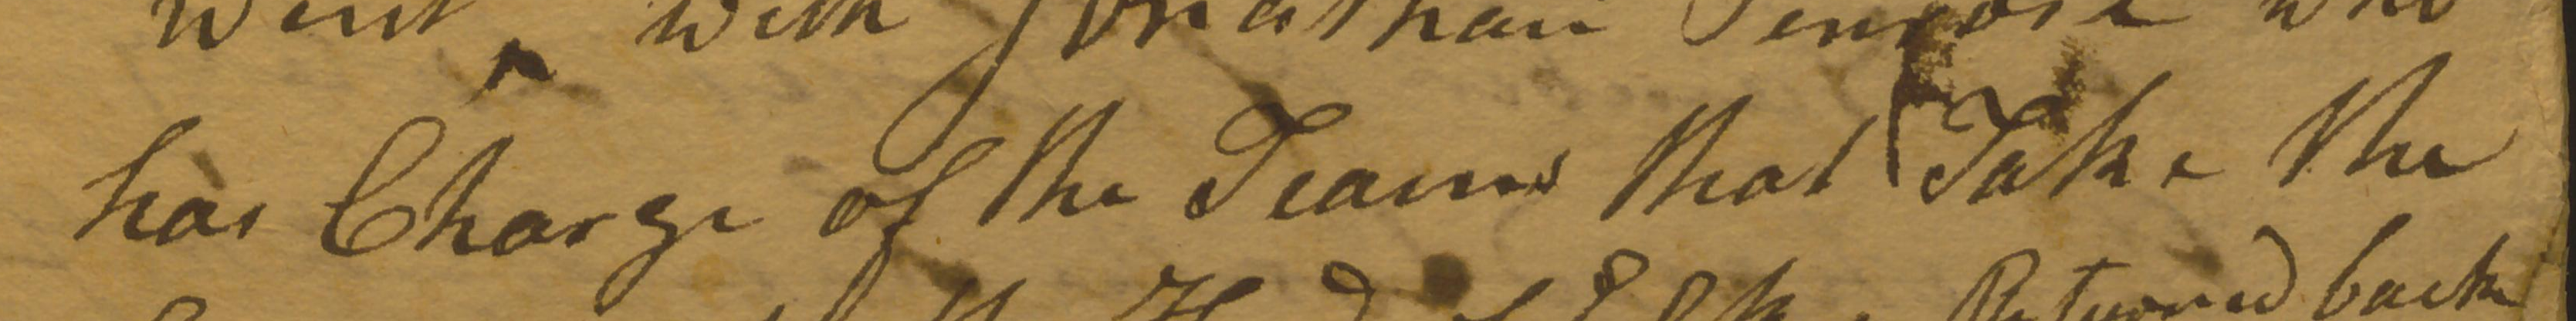has Charge of the Teams that Take the
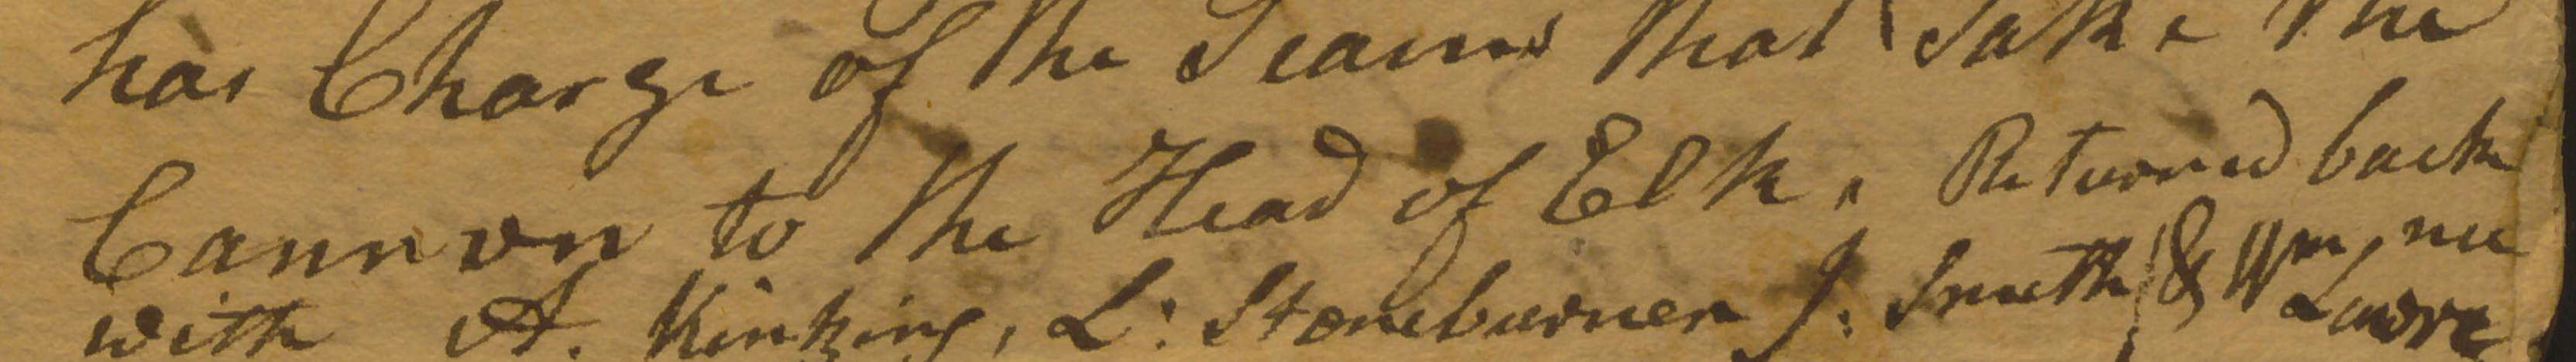Cannon to the Head of Elk, Returned back
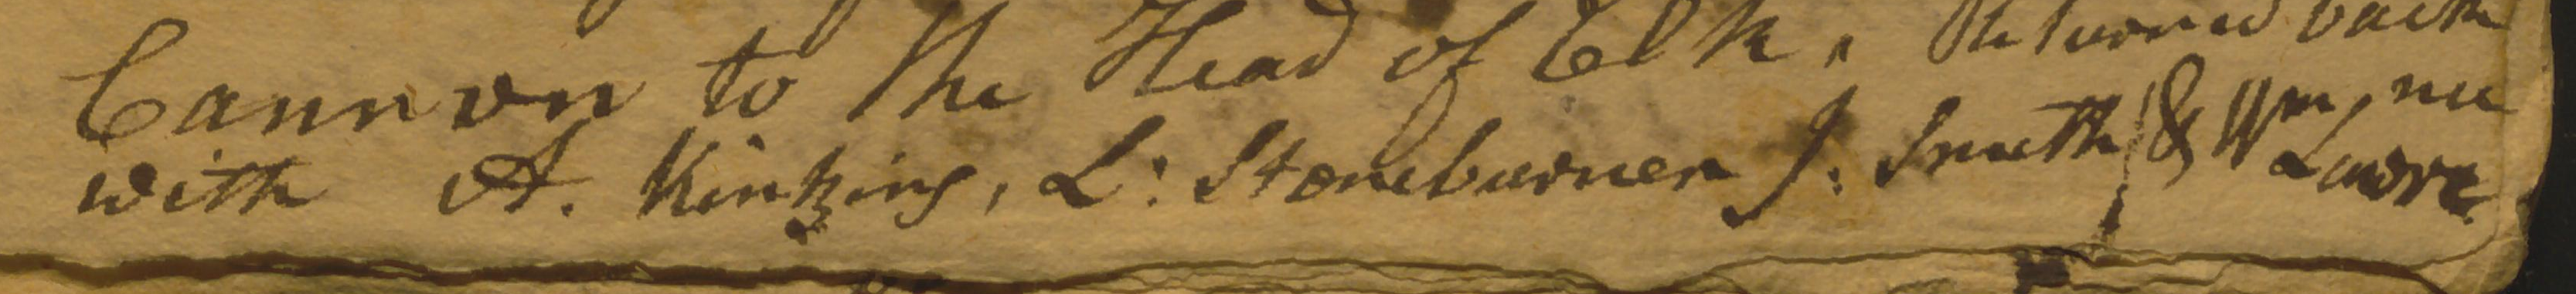with A. Kintzing, L: Stoneburner J. Smith & W^m Lawre^nce
